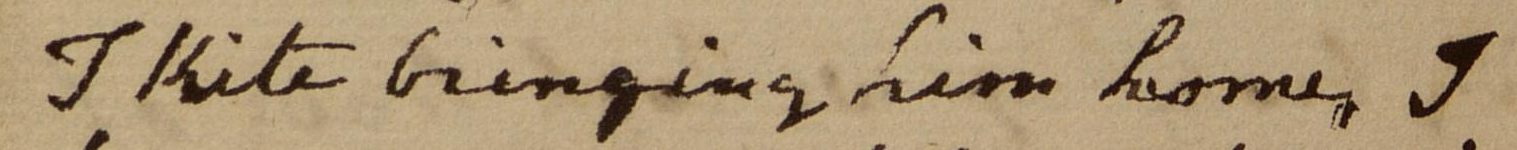T Kite bringing him home, I
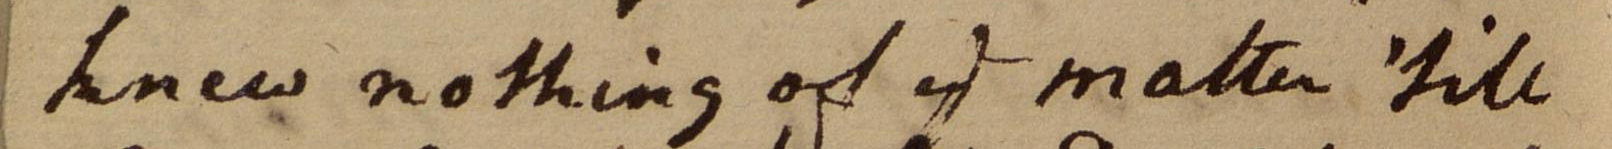knew nothing of y^e matter 'till
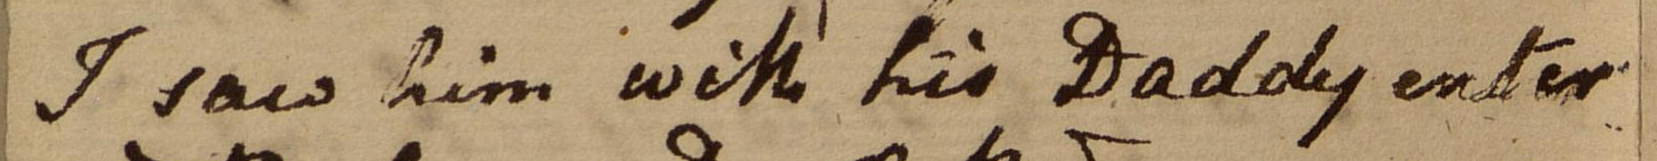I saw him with his Daddy enter
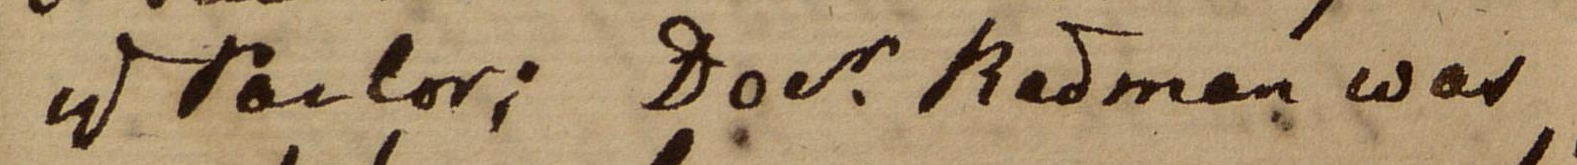y^e Parlor; Doc^r. Redman was
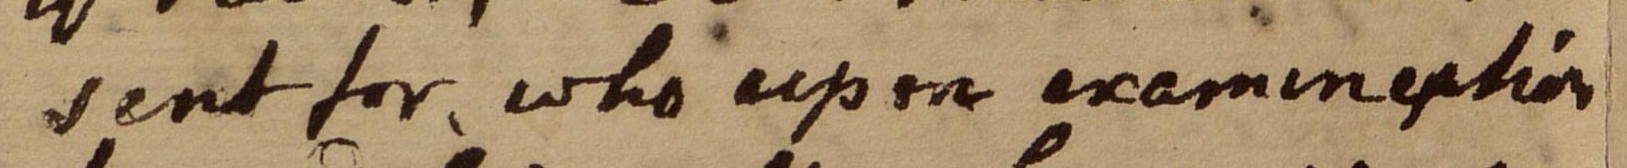sent for, who upon examination
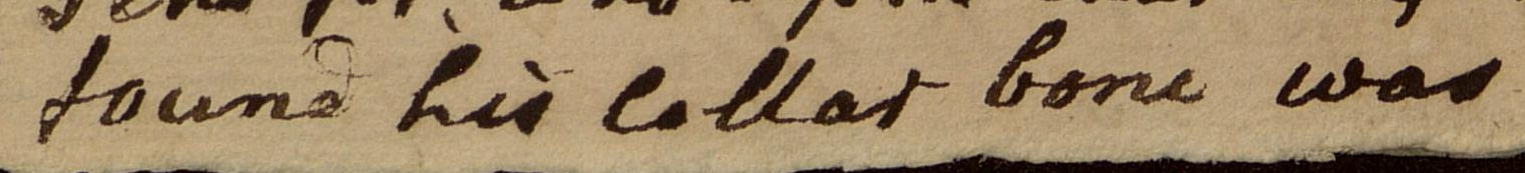found his Collar bone was
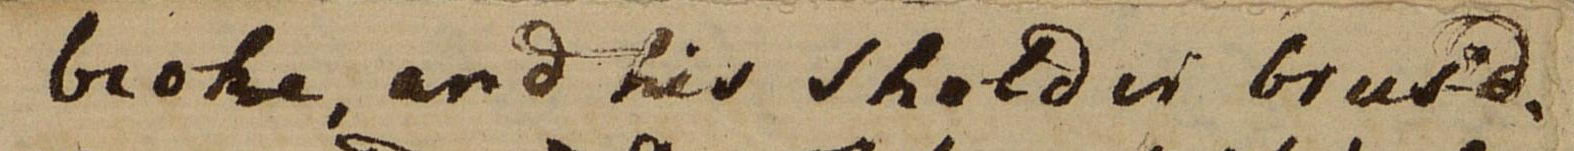broke, and his sholder brus'd,
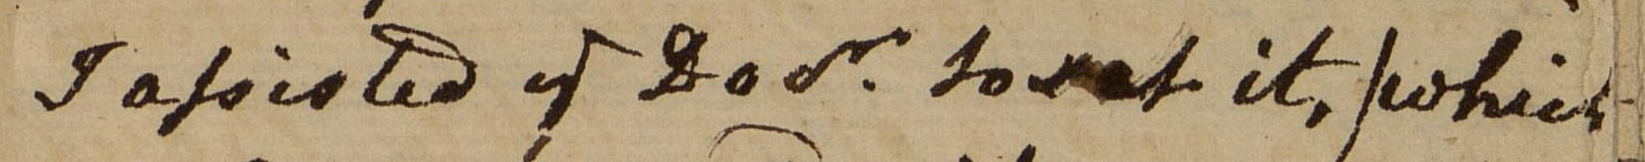I assisted y^e Doc^r. to set it, /which
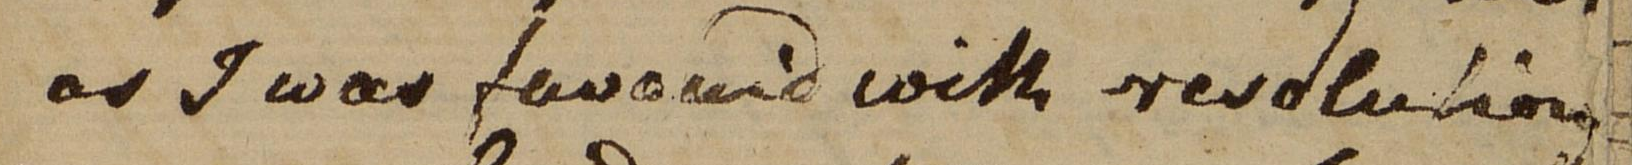as I was favour'd with resolving
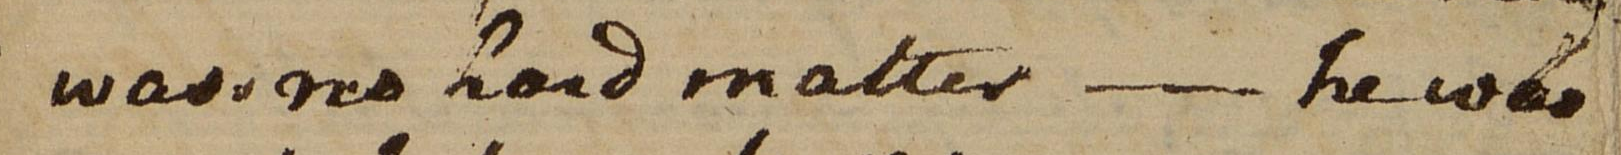was no hard matter- he was
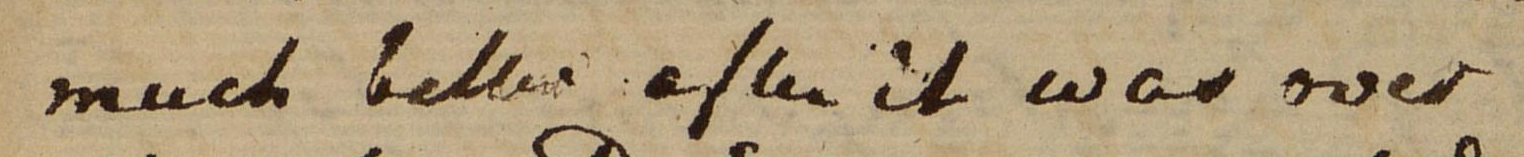much better after it was over
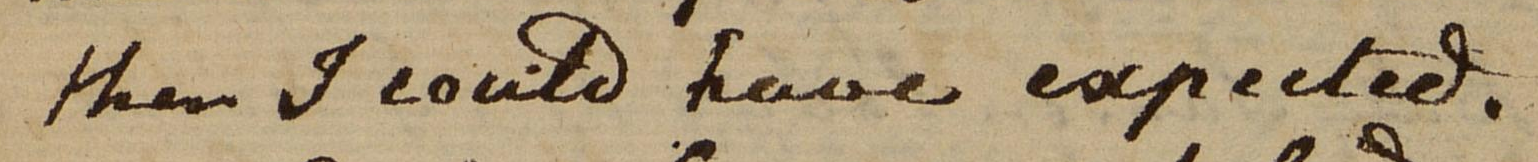than I could have expected,
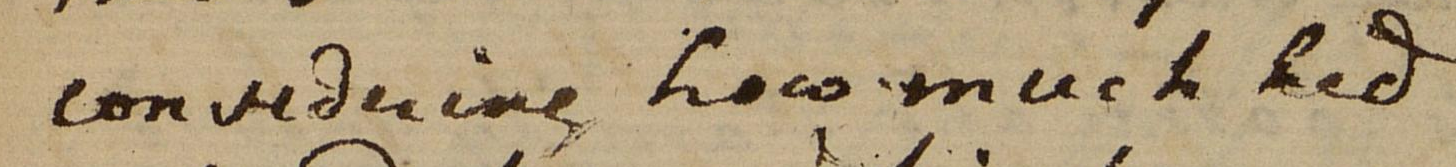considering how much had
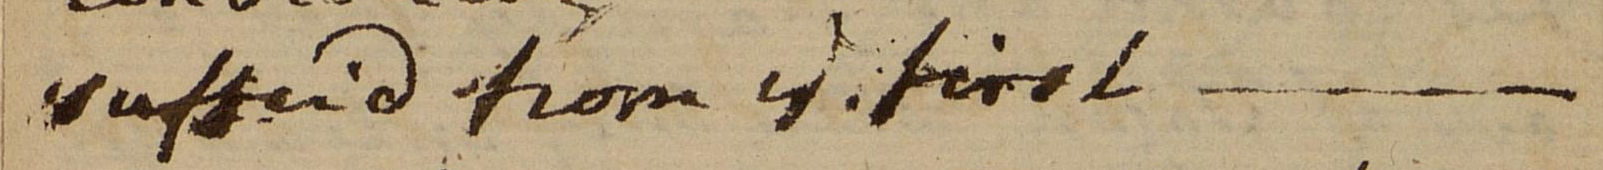suffer'd from y^e first-
